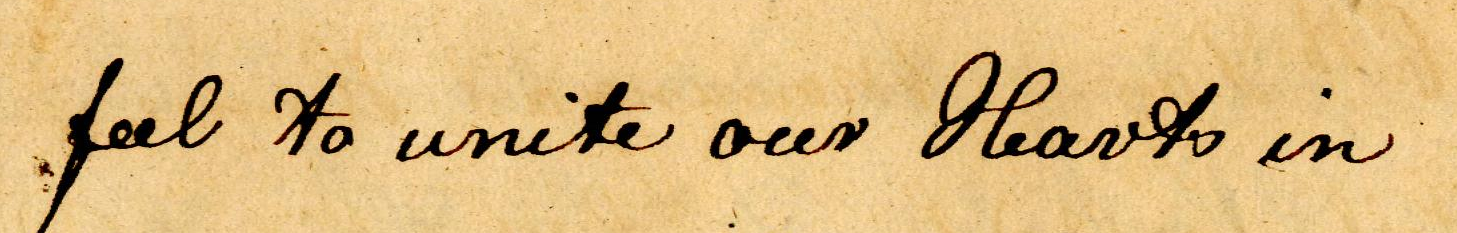feel to unite our Hearts in
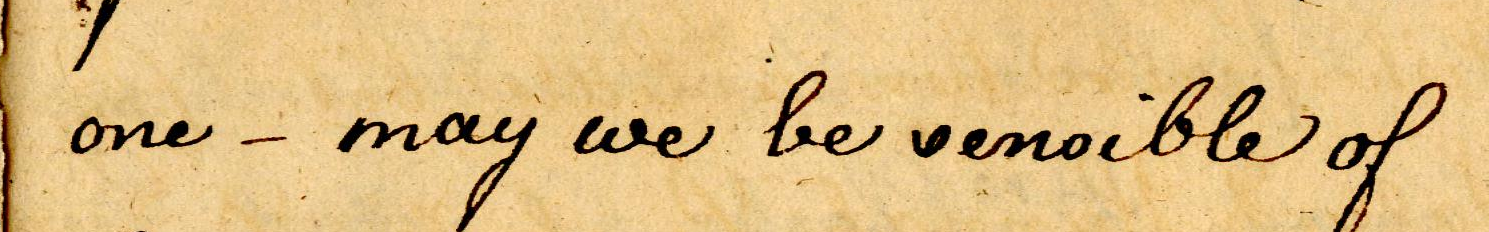one- may we be sensible of
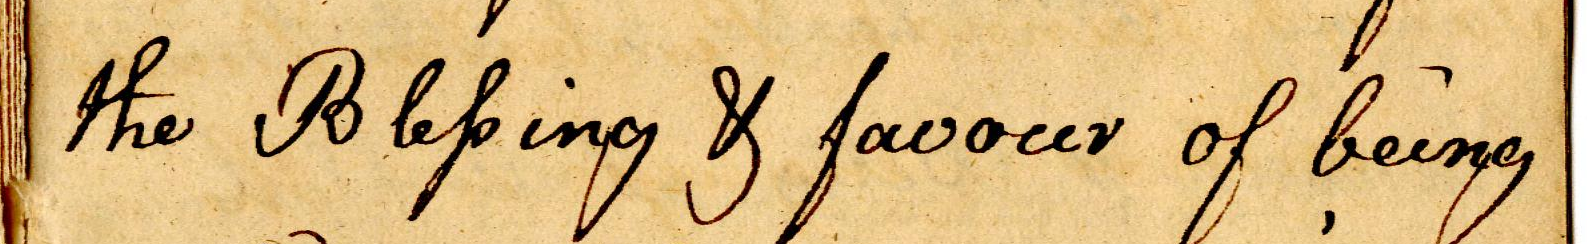the Blessing & favour of being
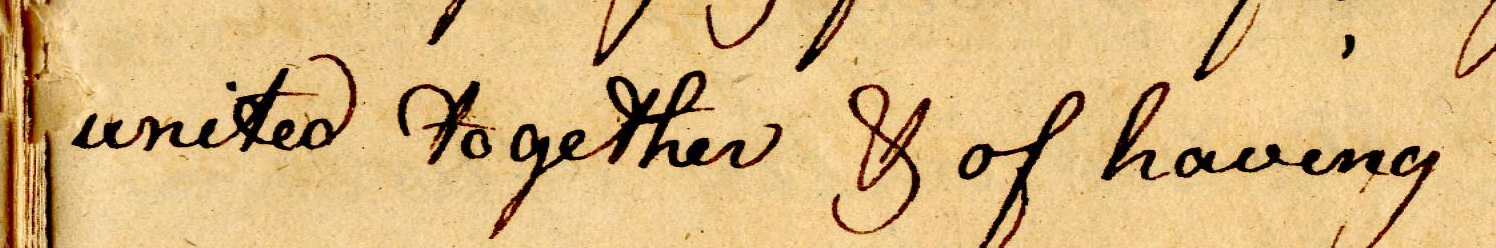united together & of having
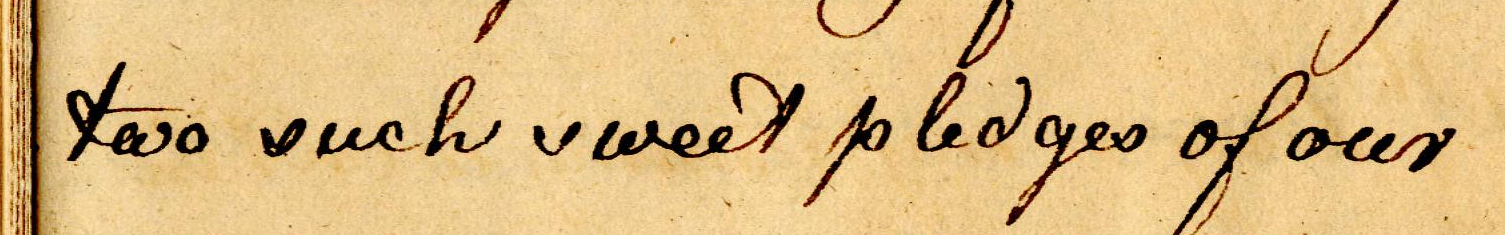two such sweet pledges of our
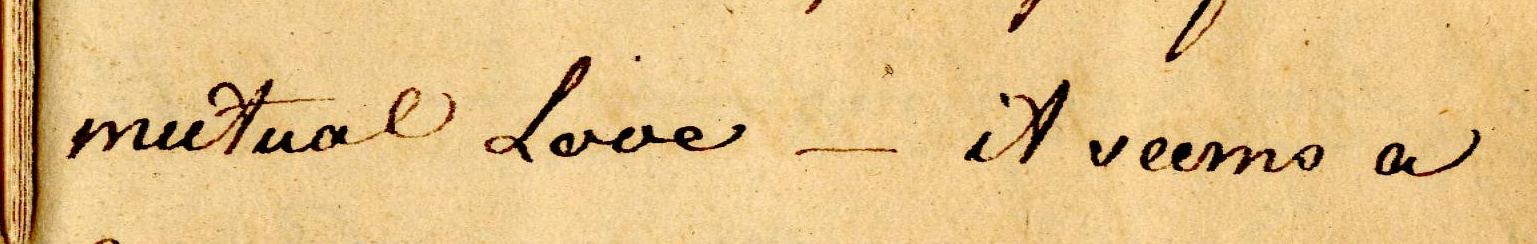mutual Love- it seems a
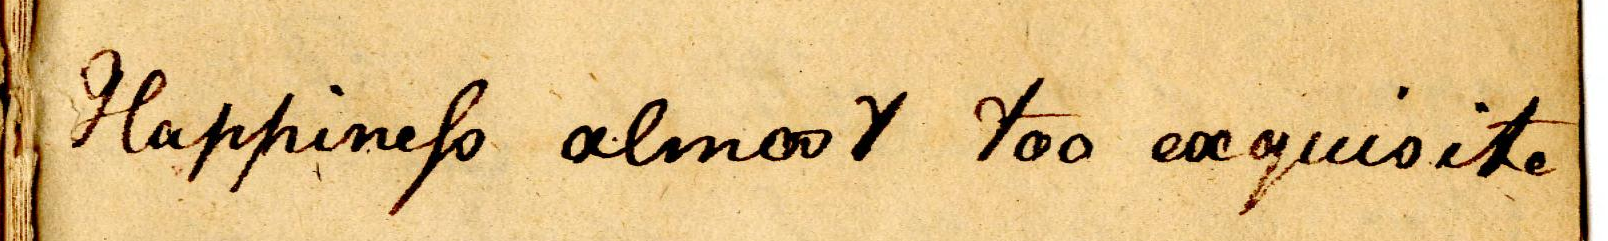Happiness almost too exquisite
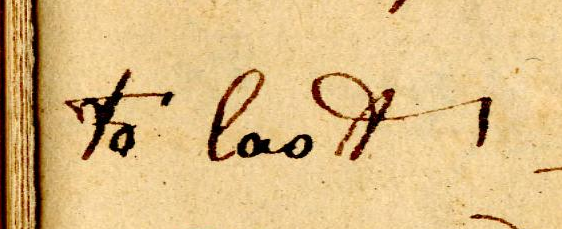to last -
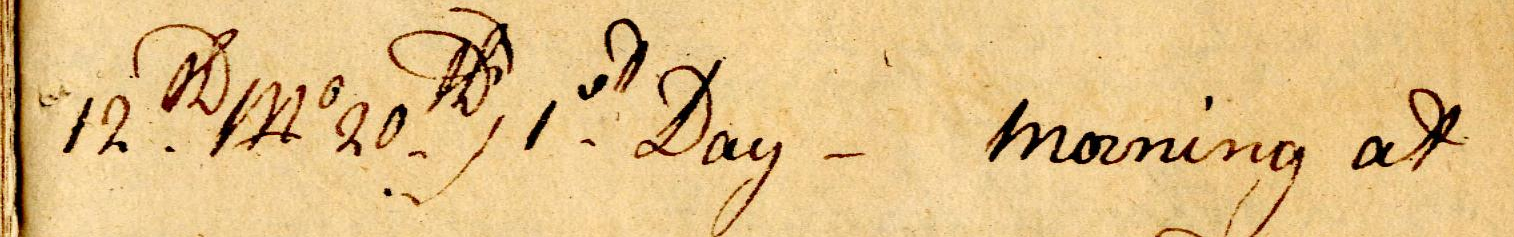12^th M^o 20^th) 1^st Day- Morning at
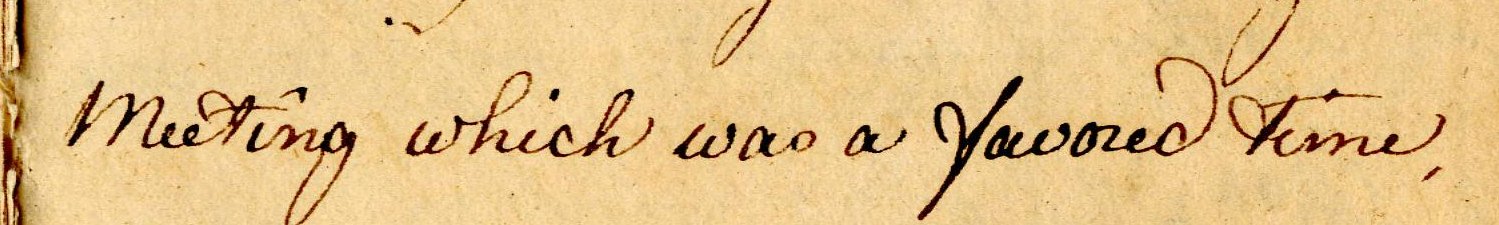Meeting which was a favored time,
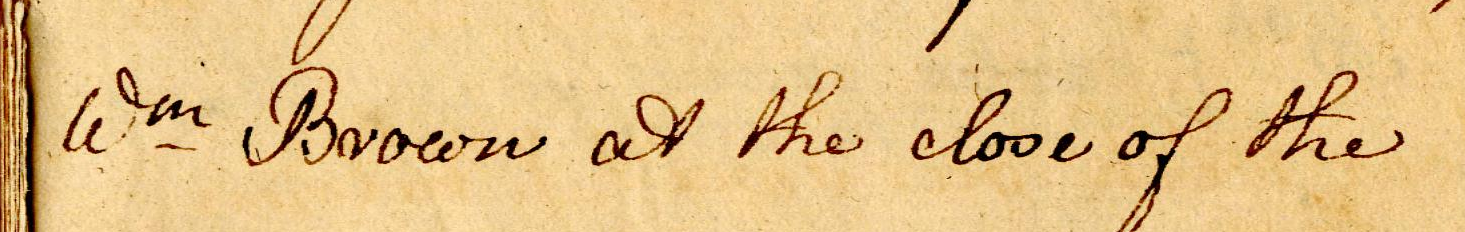W^m Brown at the close of the
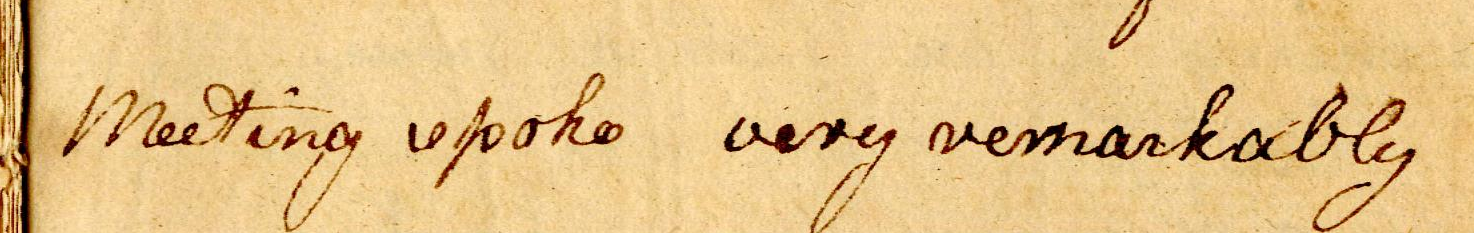Meeting spoke very remarkably
